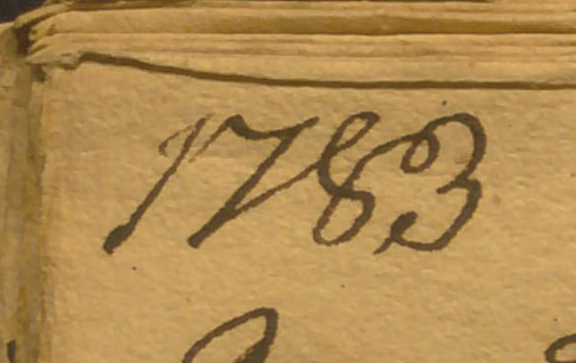1783
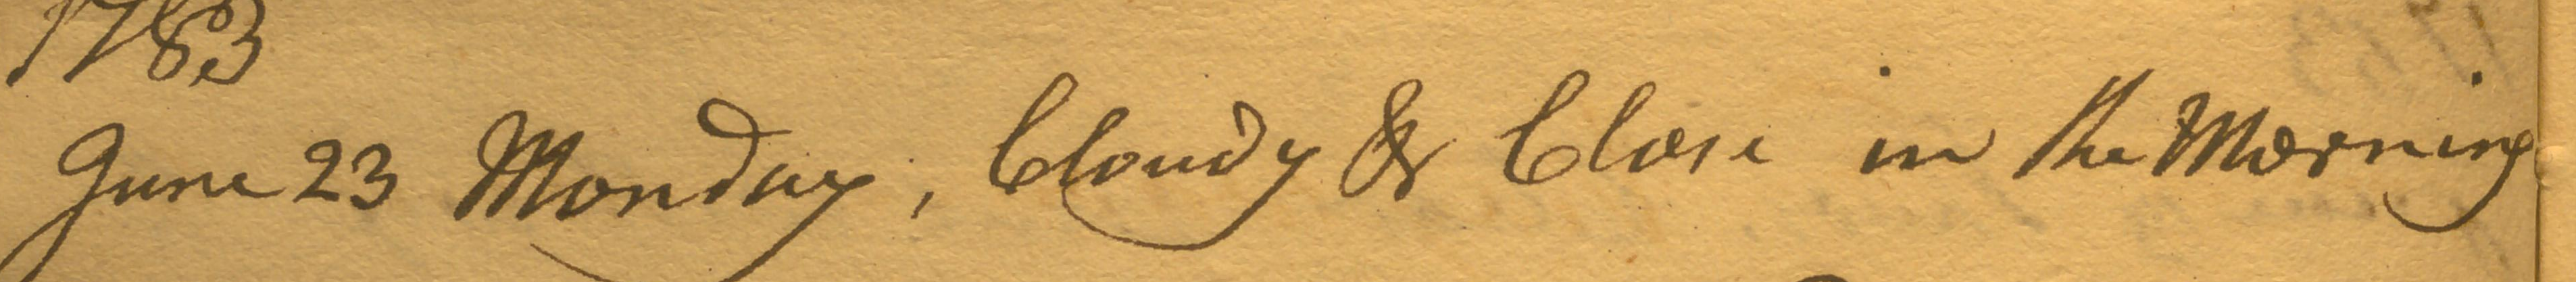June 23 Monday, Cloudy & Close in the Morning
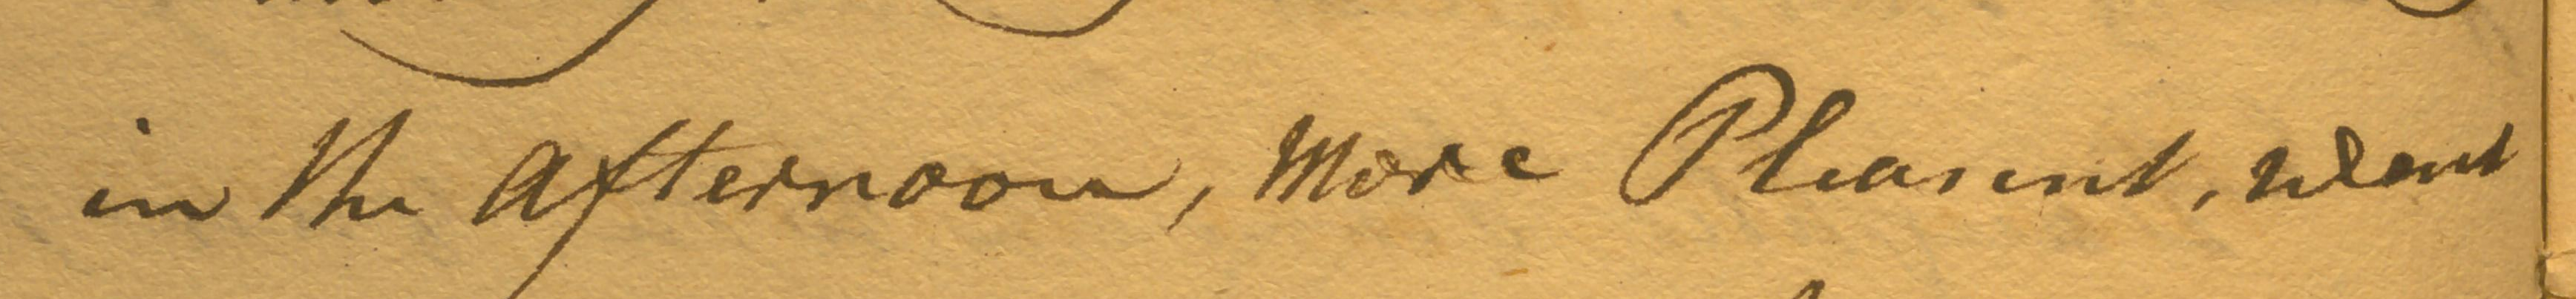in the afternoon, More Pleasent, went
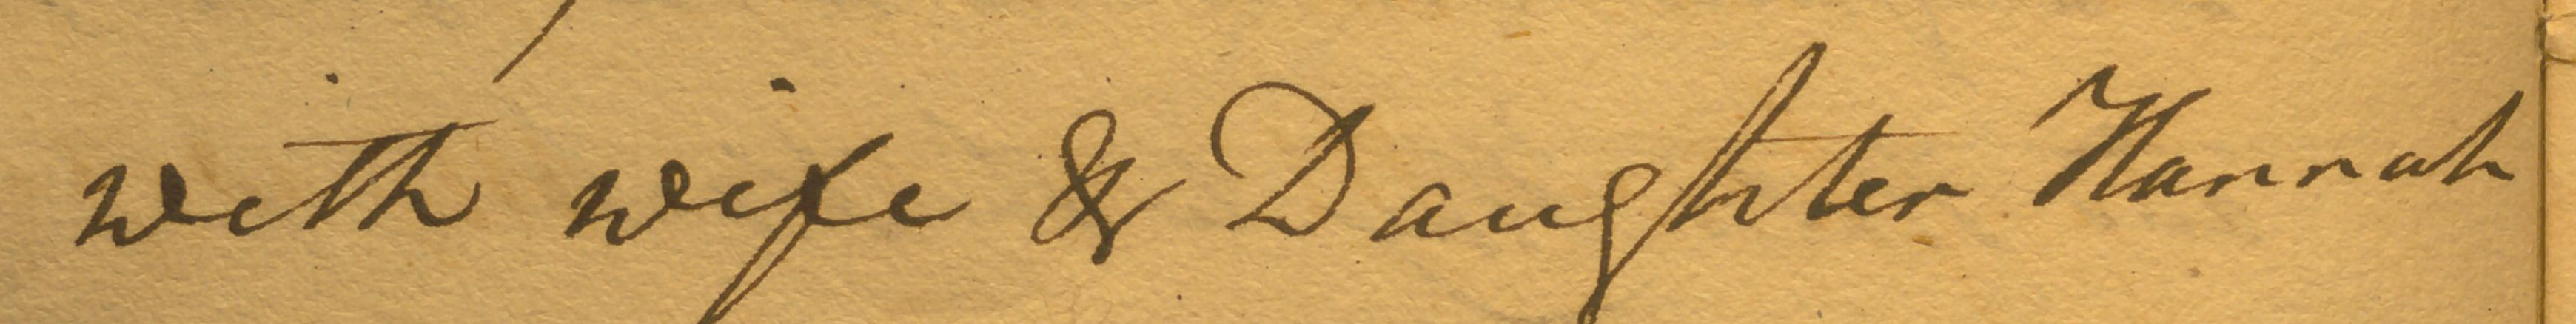with wife & Daughter Hannah
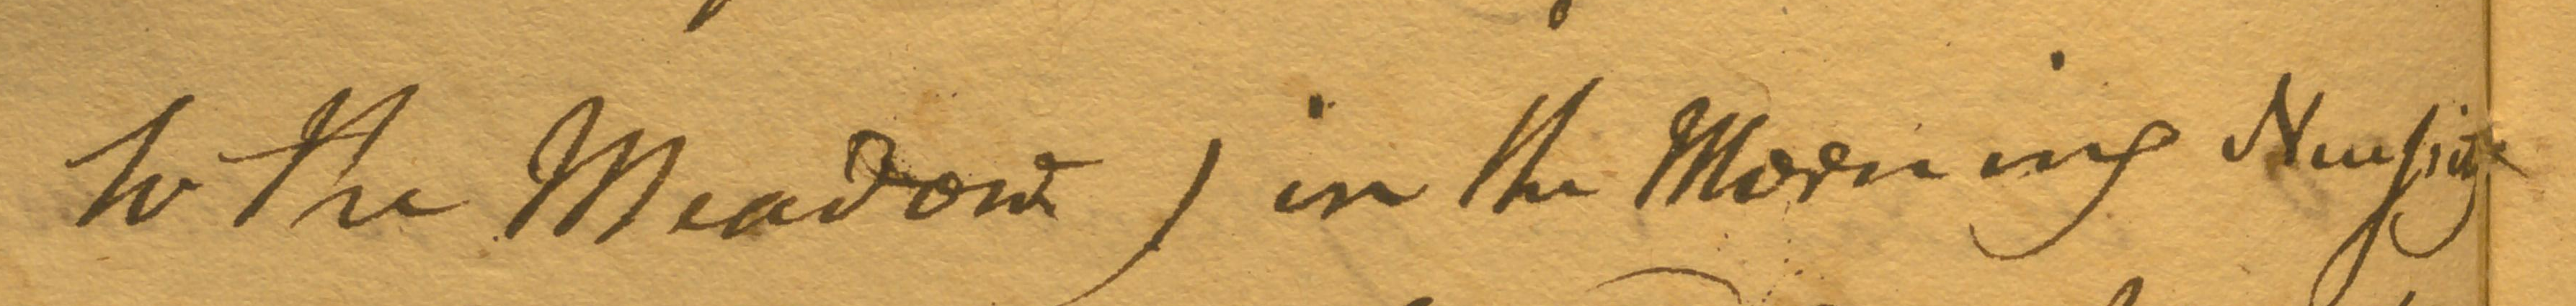to the Meadow) in the Morning Necessity
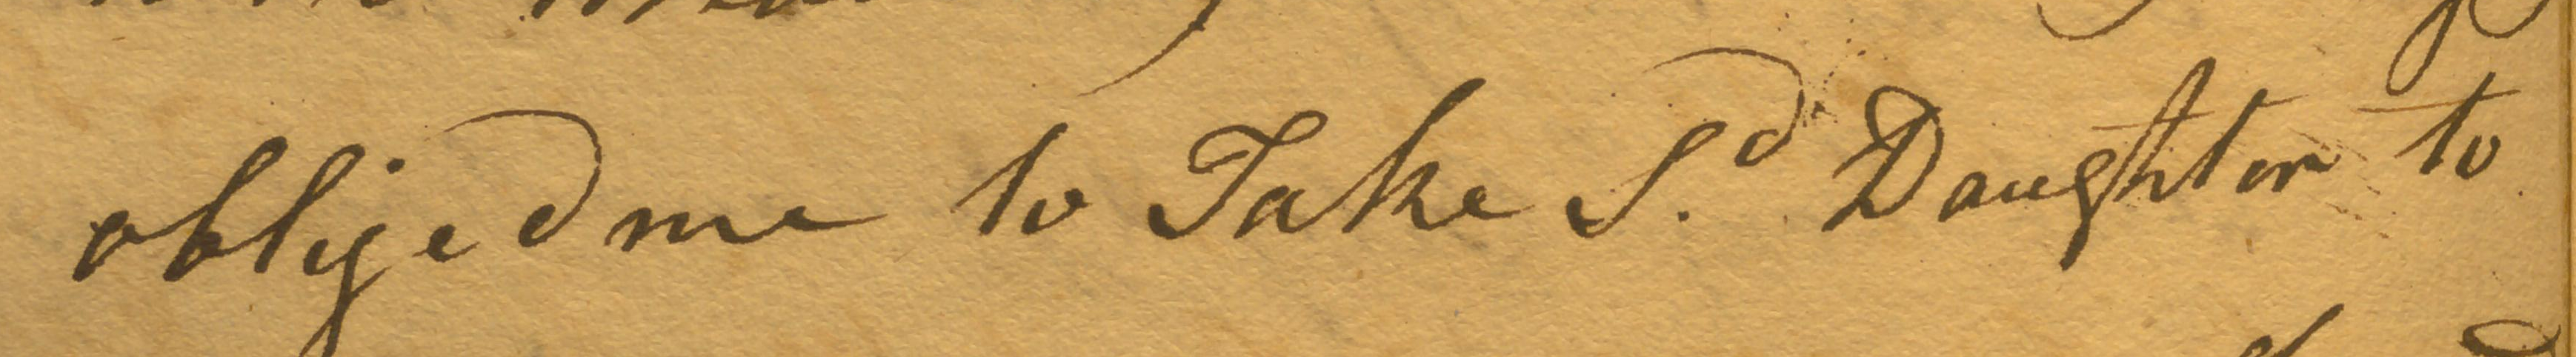obliged me to Take s^d. Daughter to
